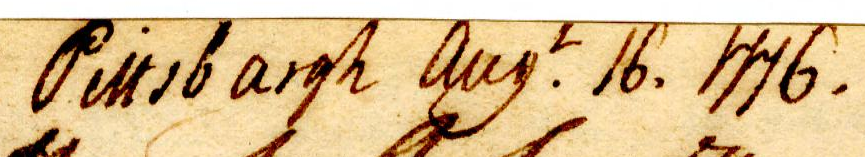Pittsbargh Aug^t. 16. 1776.
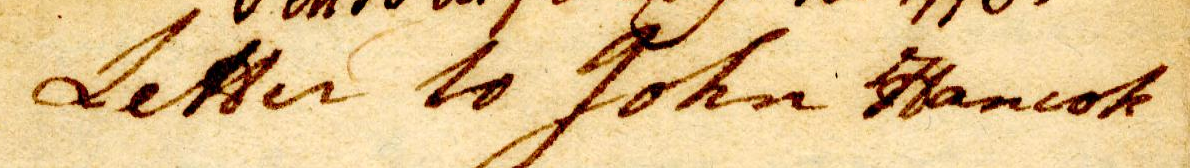Letter to John Hancock
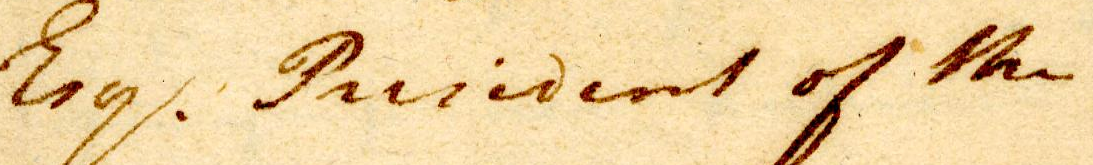Esq. President of the
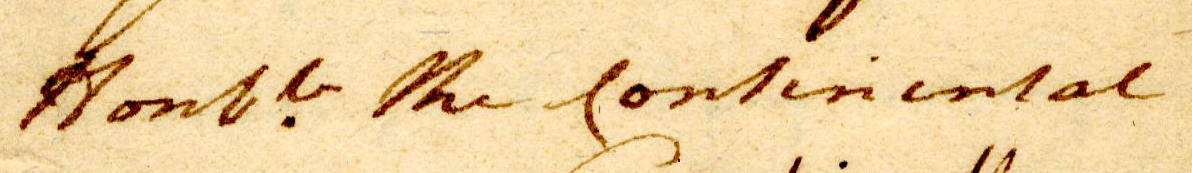Honb^l. the Continental
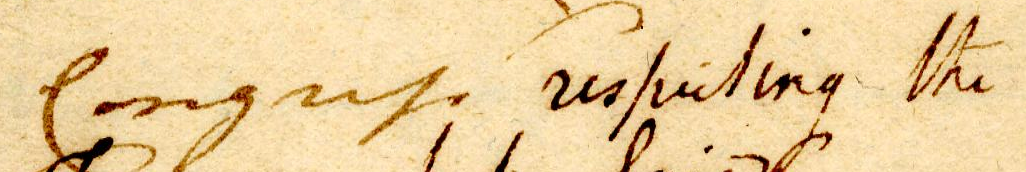Congress respecting the
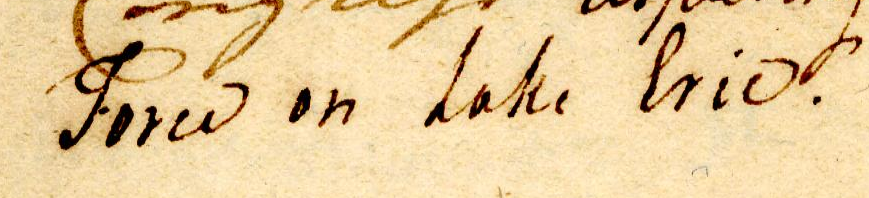Force on Lake Erie.
